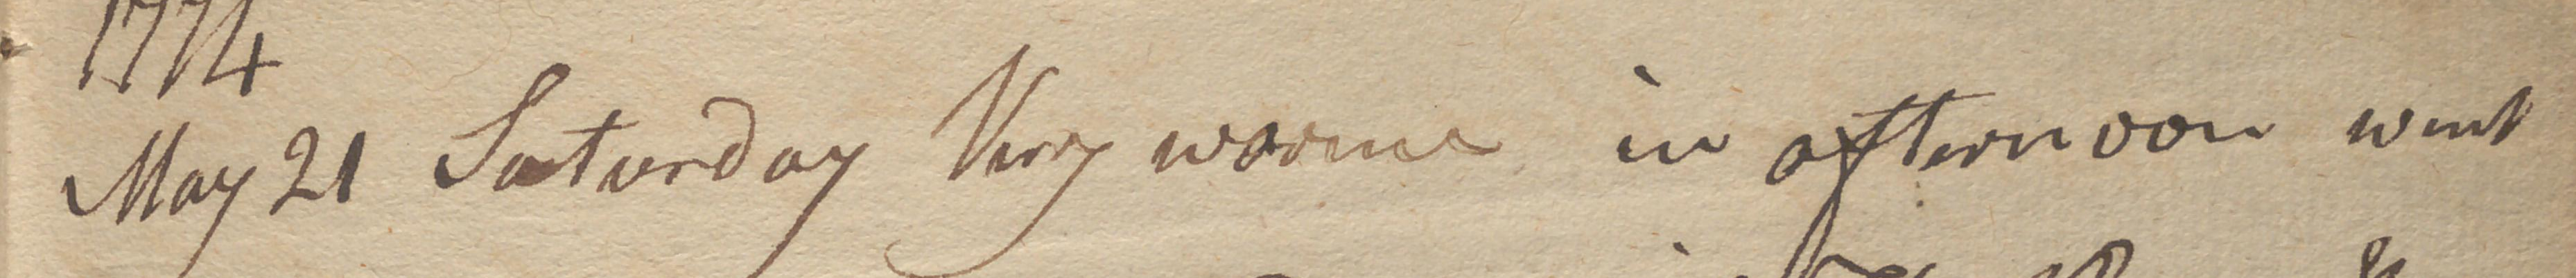May 21 Saturday Very warme, in afternoon went
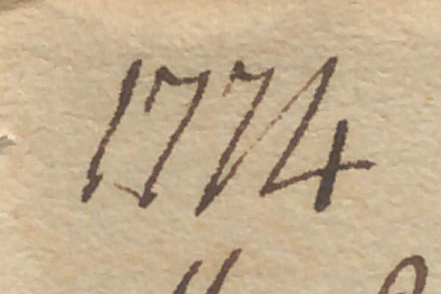1774
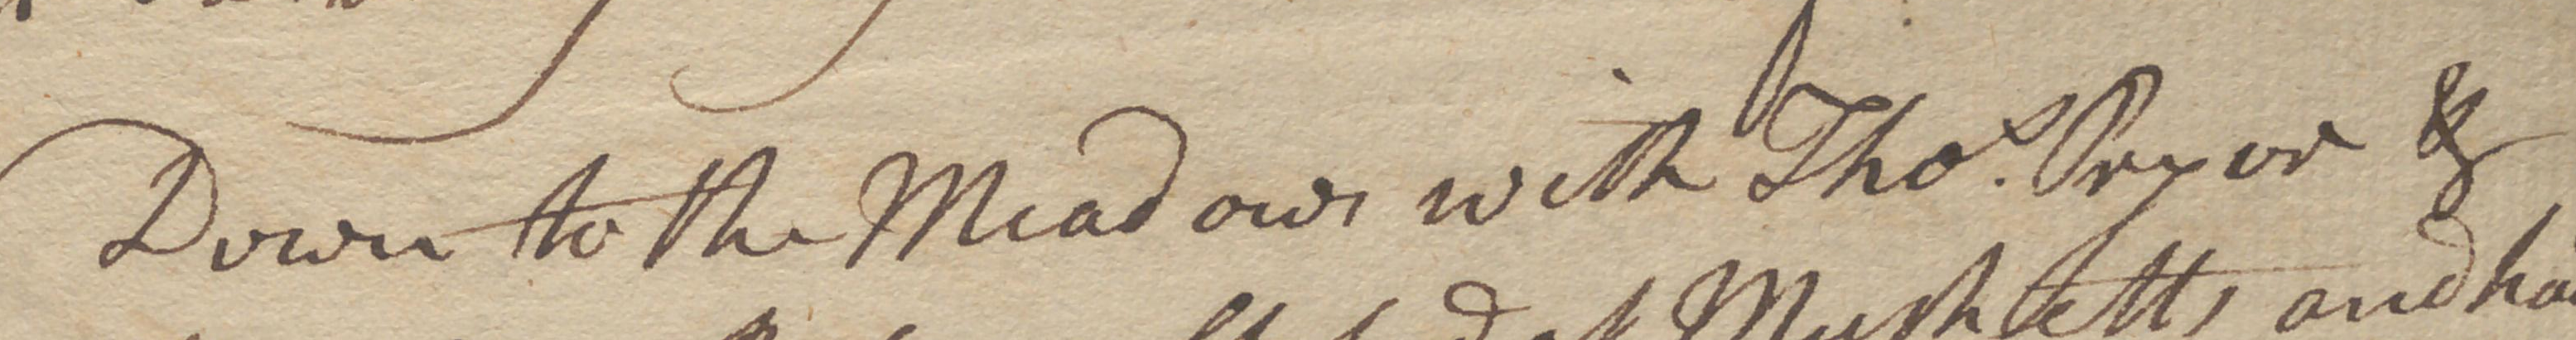Down to the Meadows with Tho^s. Pryor &
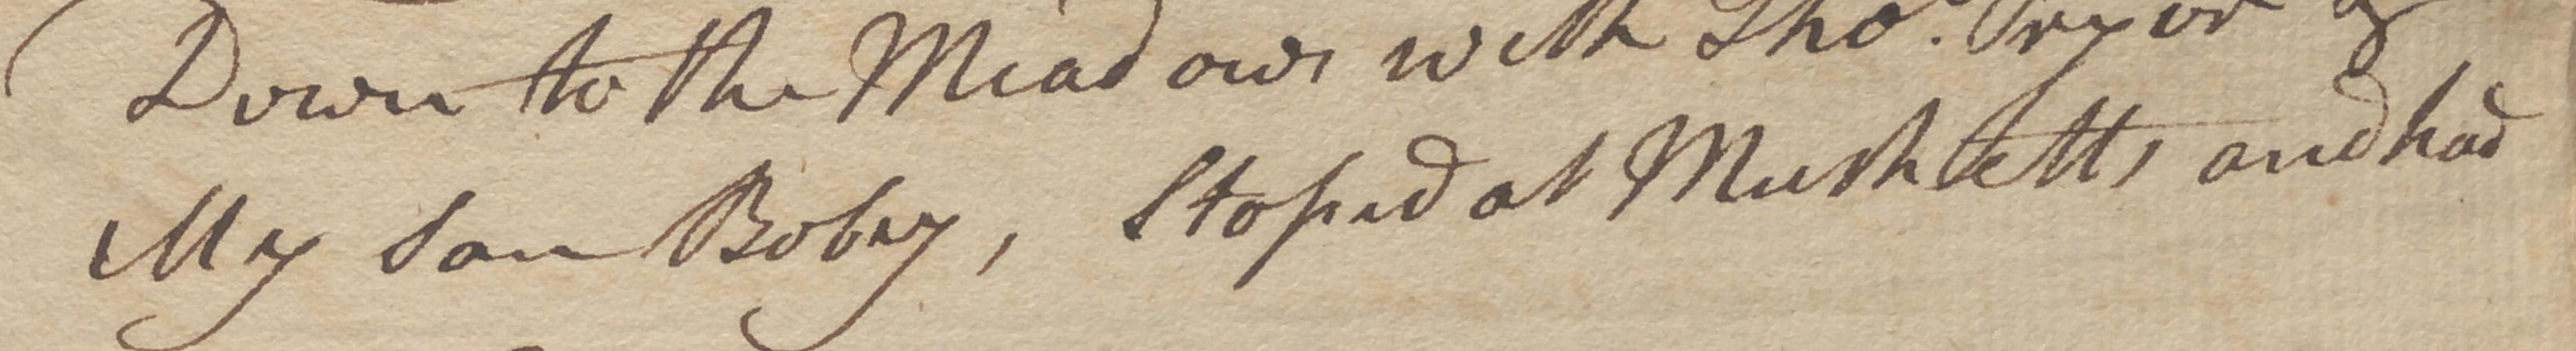My son Bobey, Stoped at Mushetts and had
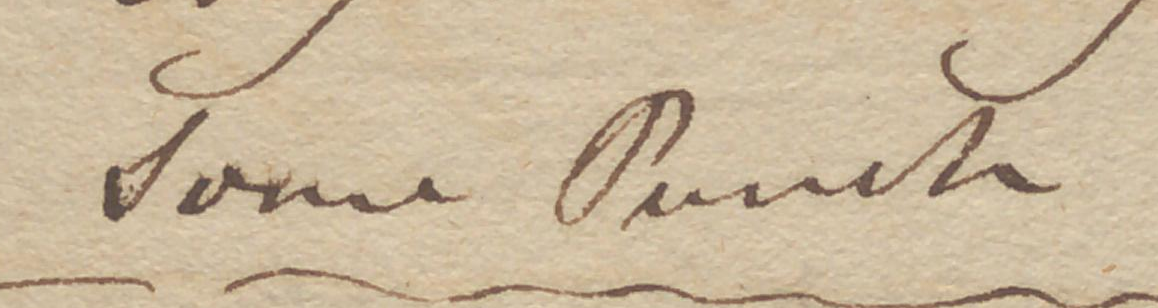some Punch
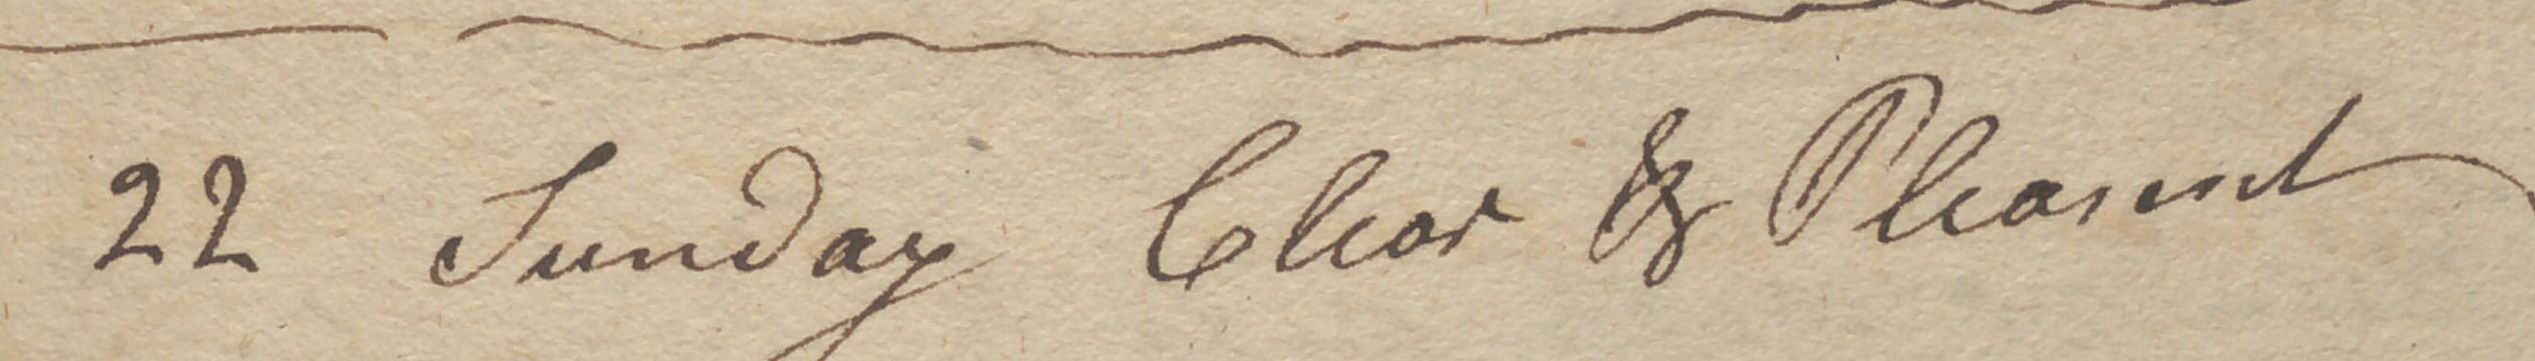22 Sunday Clear & Pleasent
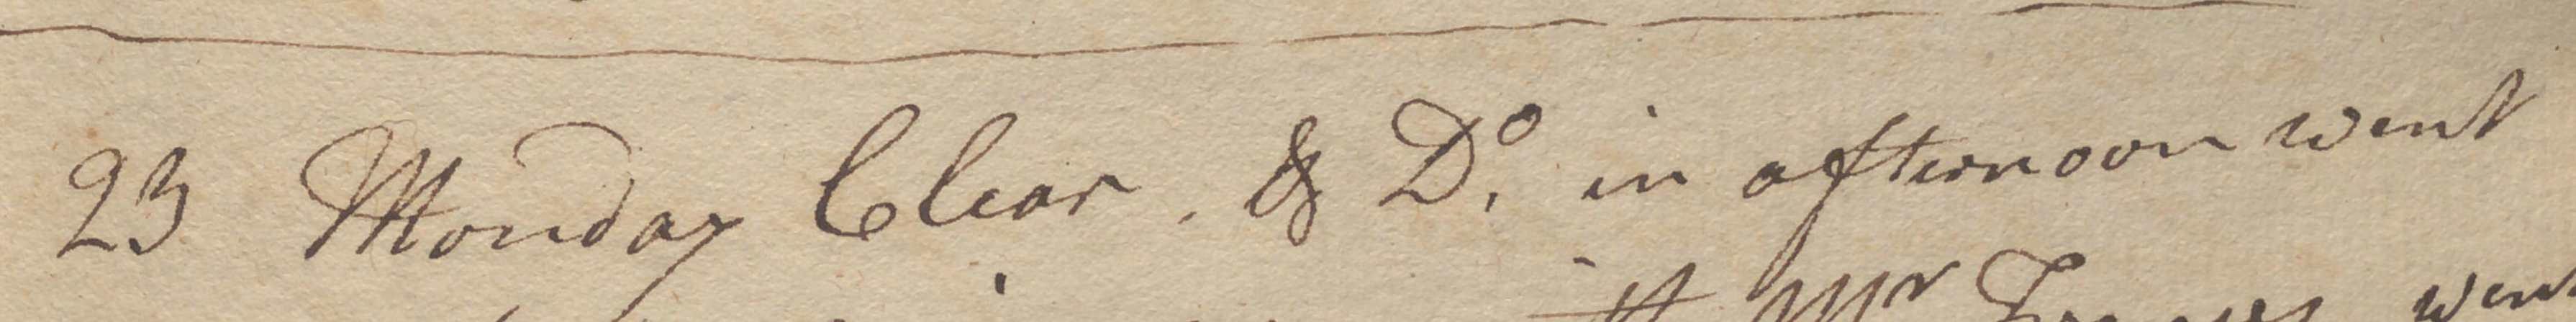23 Monday Clear, & D^o. in afternoon went
